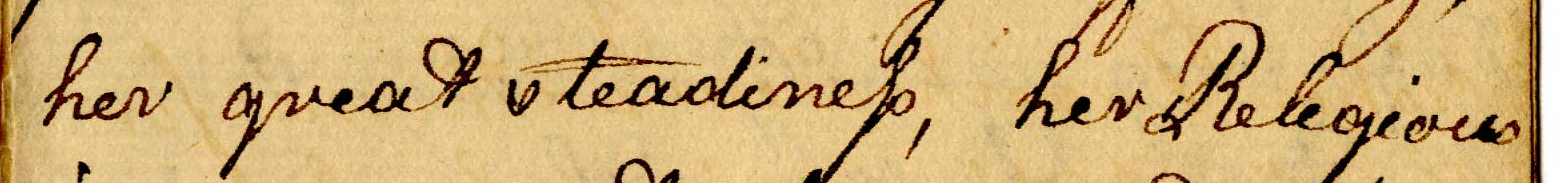her great steadiness, her Religious
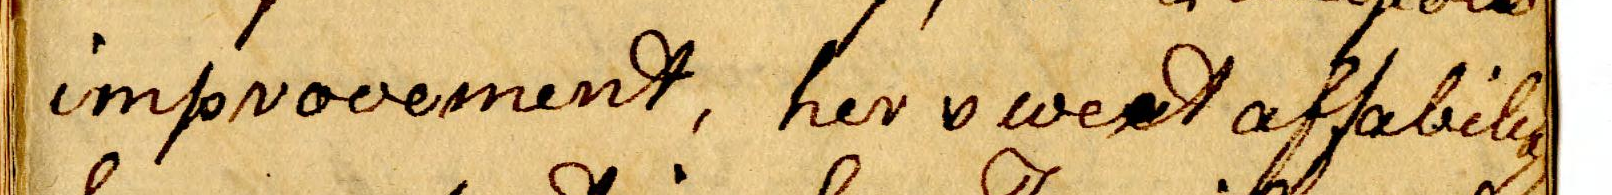improvement, her sweet affability
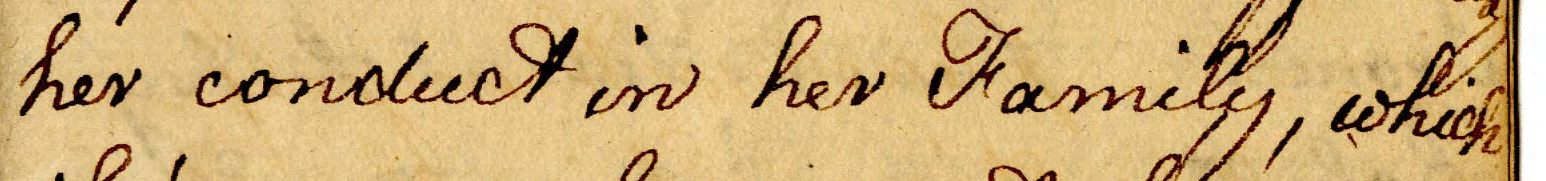her conduct in her Family, which
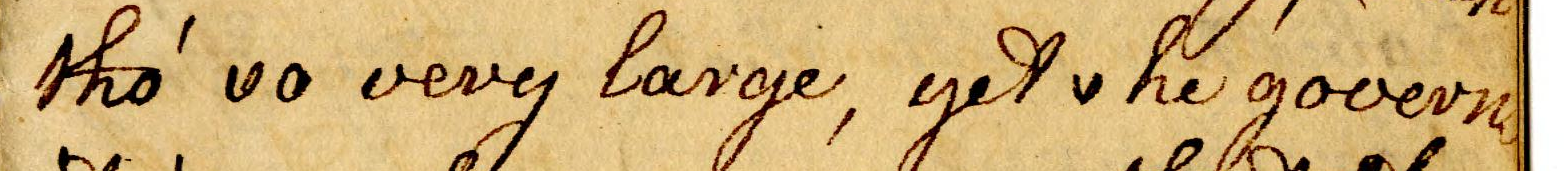tho' so very large, yet she govern
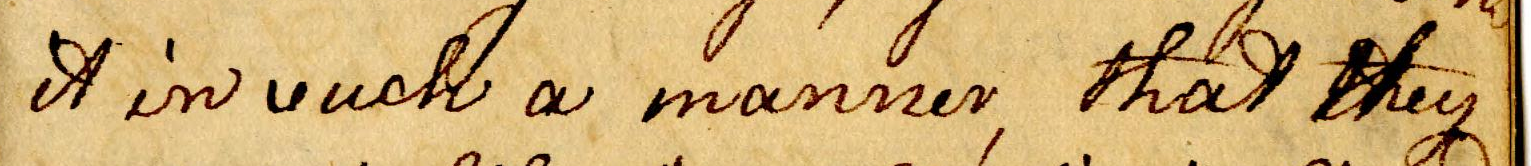it in such a manner that they
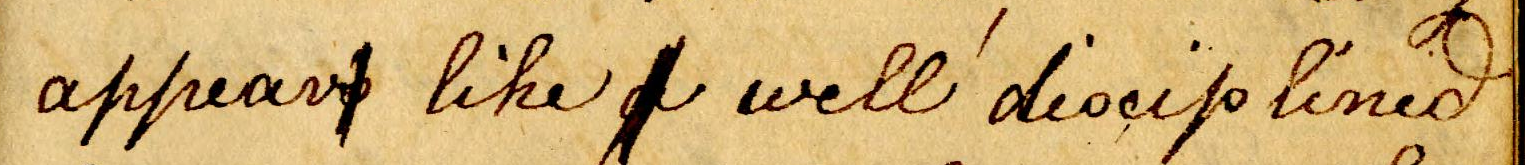appears like a well disciplined
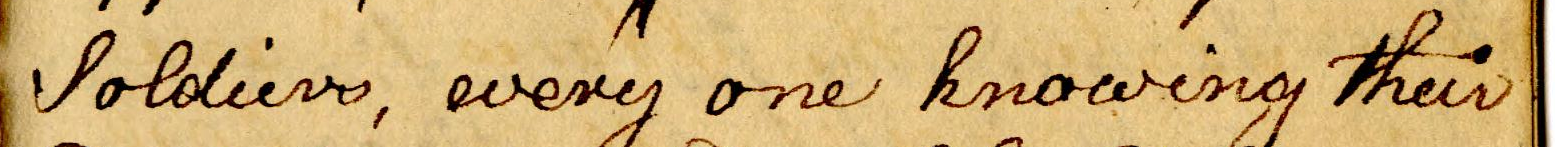Soldiers, every one knowing their
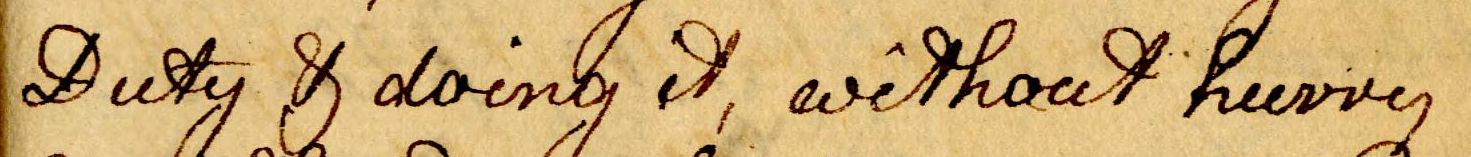Duty & doing it, without hurry
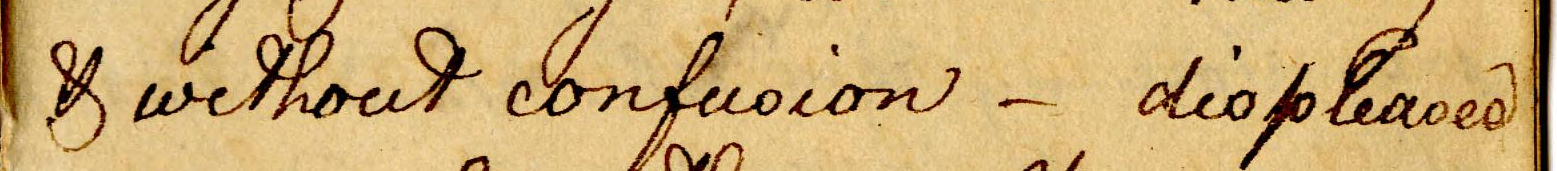& without confusion- displeased
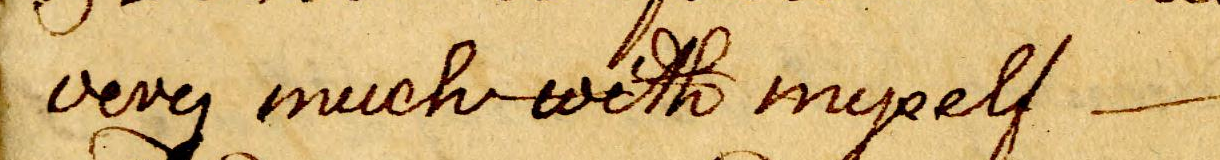very much with myself-
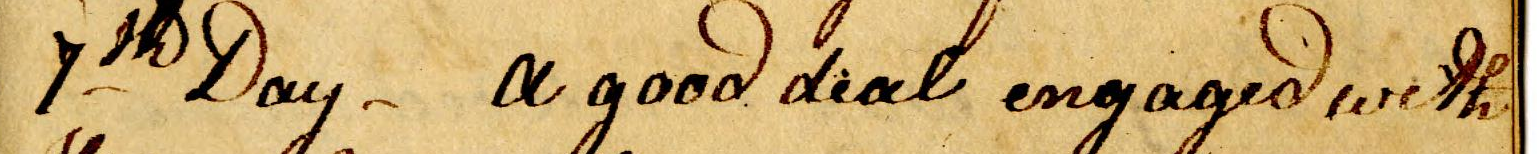7^th Day- a good deal engaged with
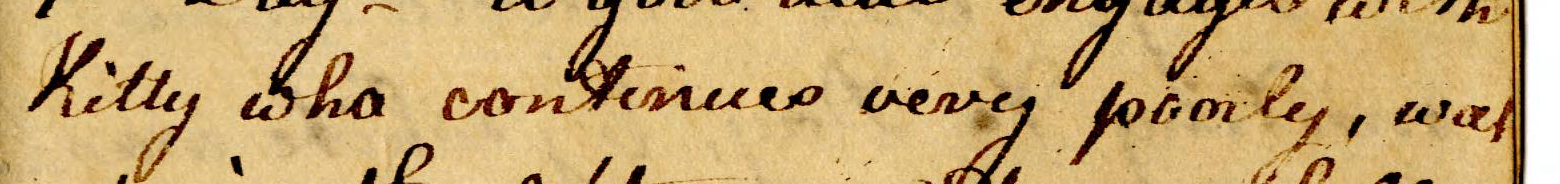Kitty who continues very poorly, was
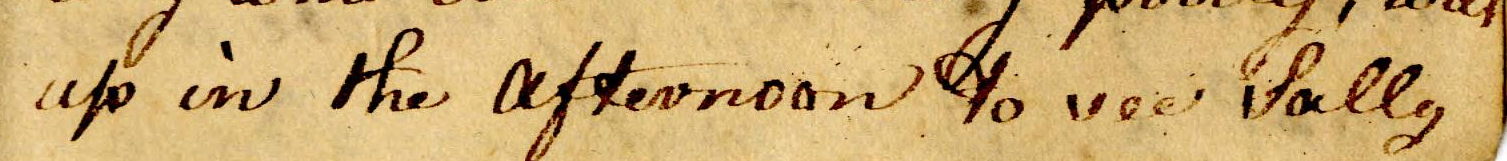up in the Afternoon to see Sally
